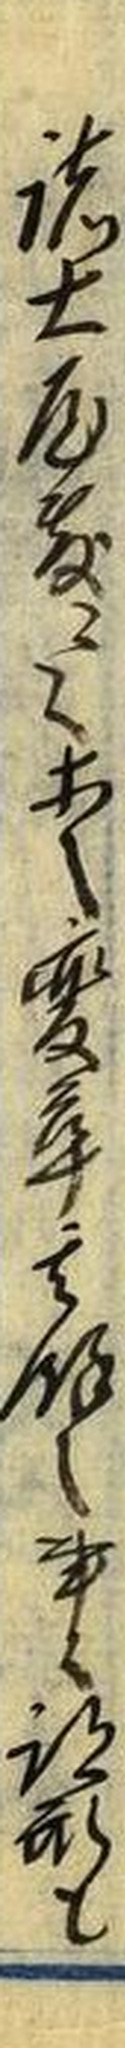諸士屋敷々々等之変革其余之事々跡形も
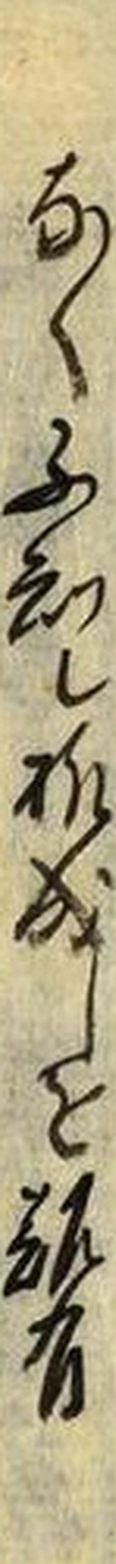なく不知れ様成しを難有
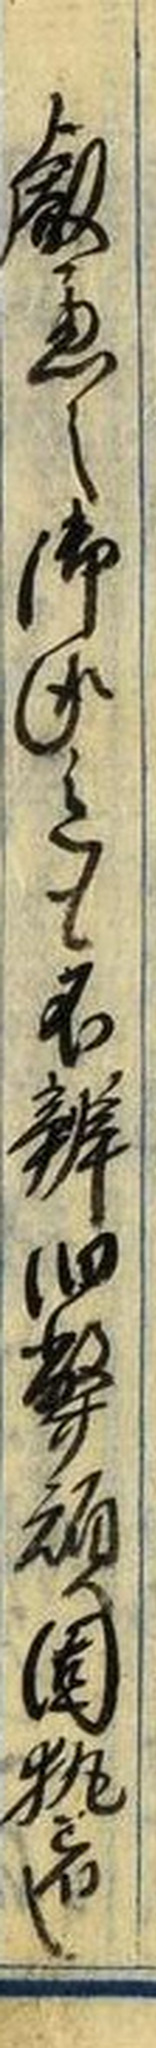叡慮之御趣意も不弁旧弊頑固執着之
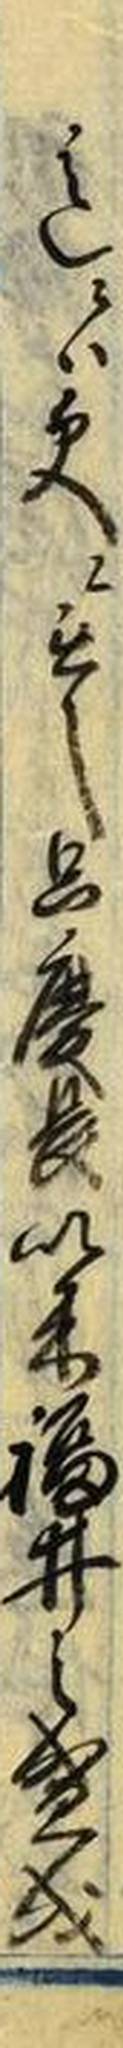意には更に無之只慶長以来福井之盛成

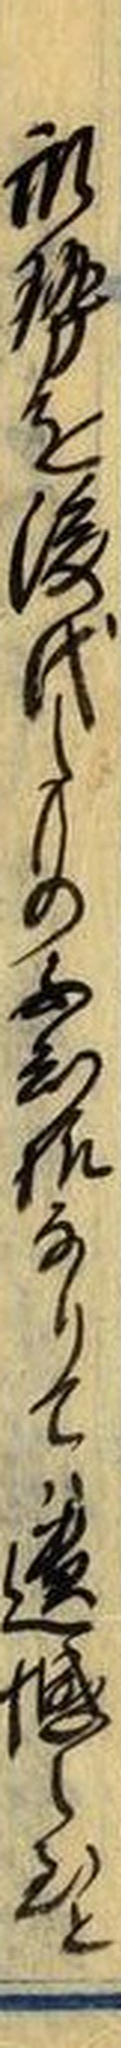形勢を後代之もの不知様なりては遺憾之至と
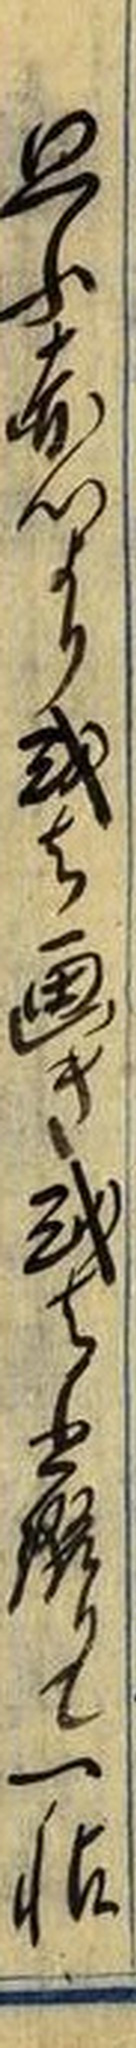思ふ赤心より或は画き或は書綴りて一帖
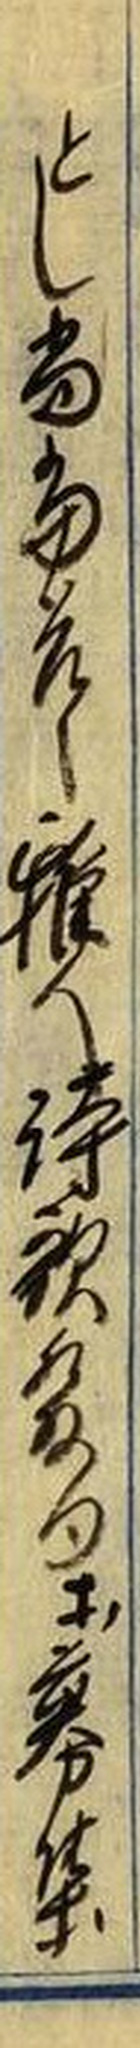とし尚当節之雅人詩歌発句等募集
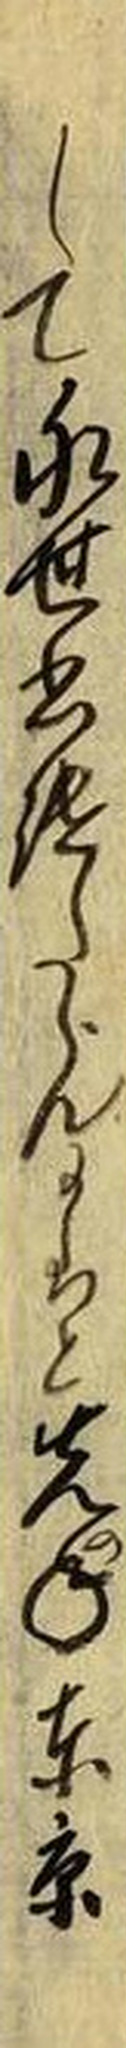して永世書継たらんにはと先の年東京
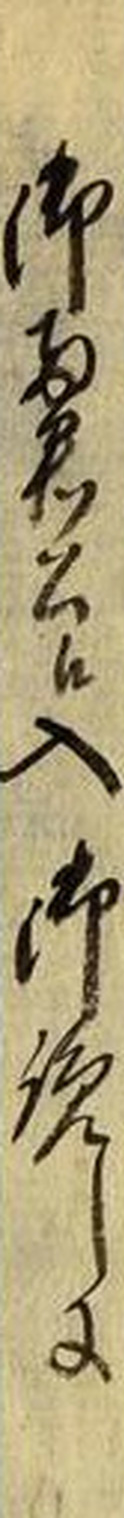御両君公え入御覧しに
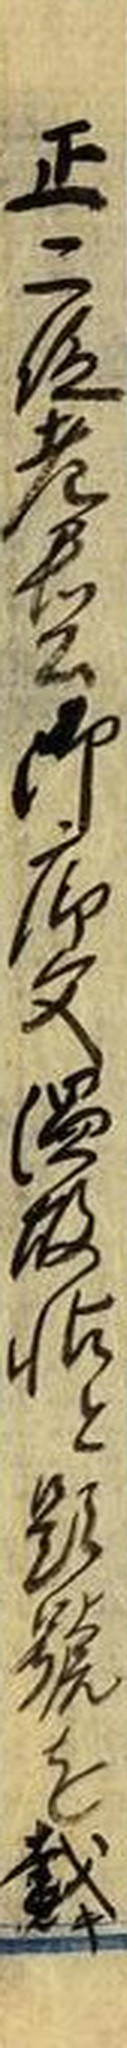正二位老君公御序文温故帖と題号を戴き
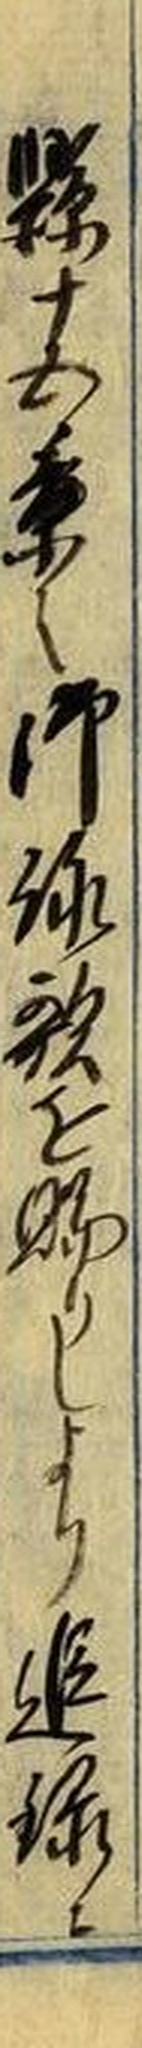縣十五章之御詠歌を賜りしより追録に
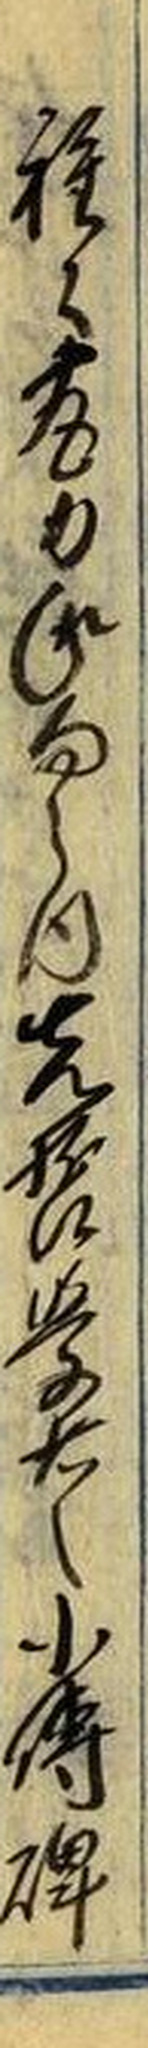種々尽力趣句之内先哲学者之小伝碑
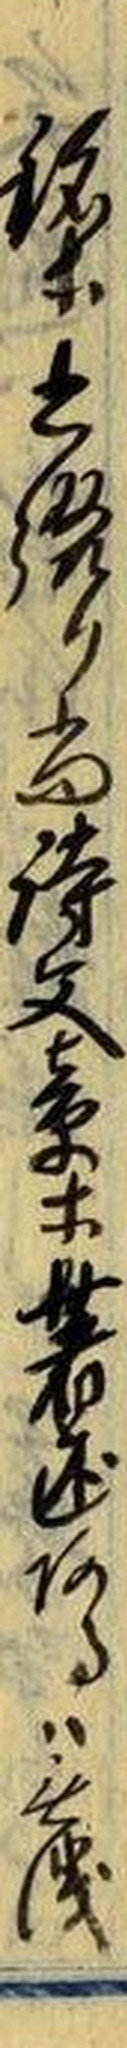銘等書綴り尚詩文章等著述あるは無洩
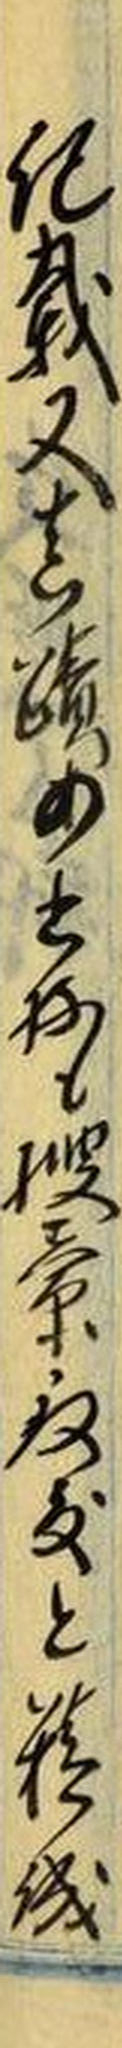記載又真蹟の書抔も捜索致度と精誠
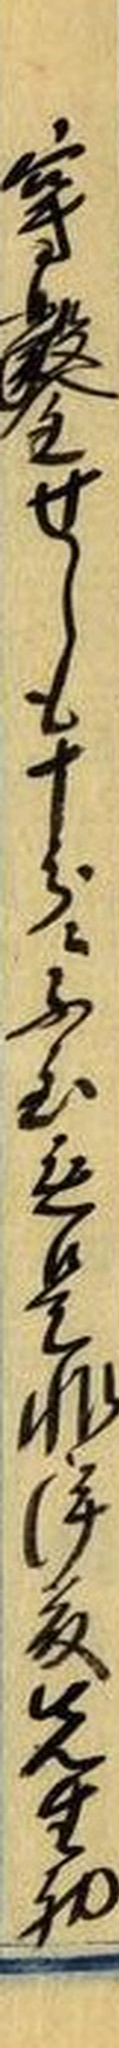穿鑿せしも十分に不至無是非伊藤先生初
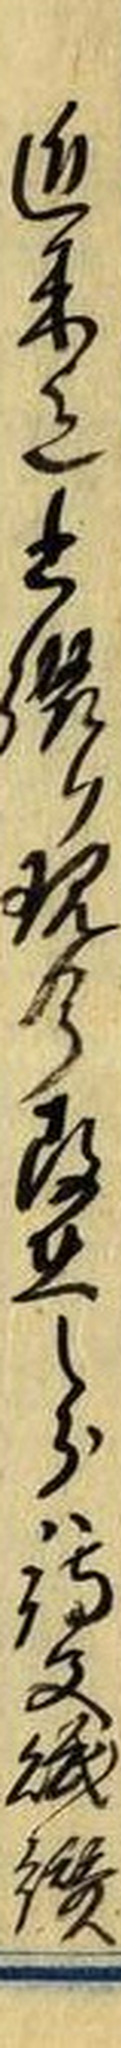近来迄書綴り現今改在し分は詩文賦讃
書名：温古集 四巻
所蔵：福井県文書館 Fukui Prefectural Archives
